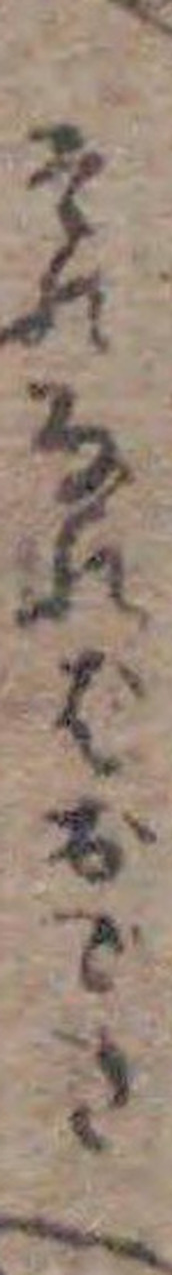それなればおでき
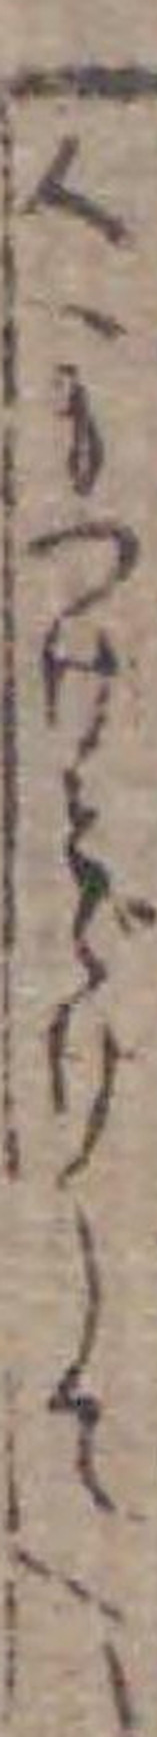人へもつけとゞけして
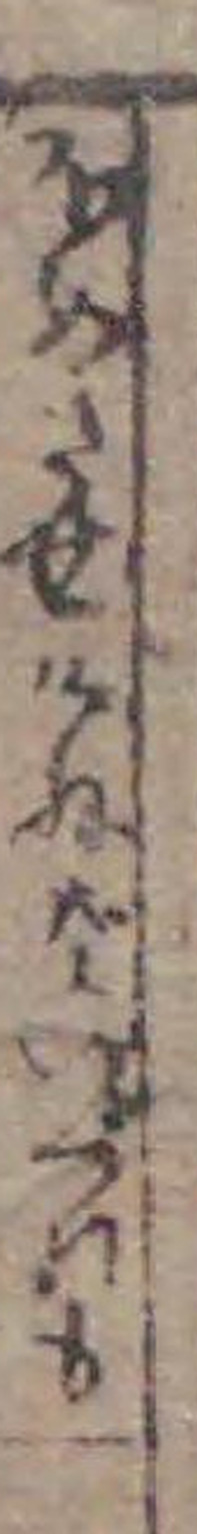ほめさせければいづれも
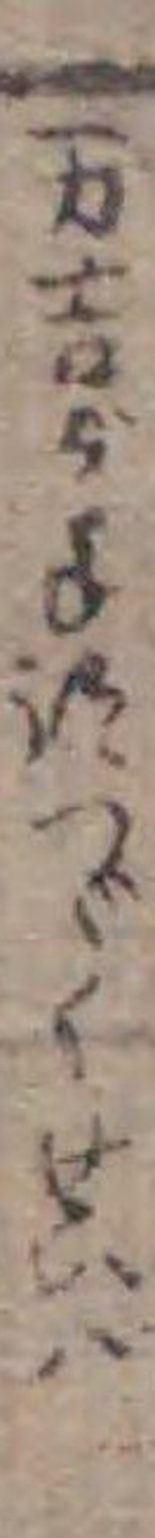万吉が手跡つゞくせいば
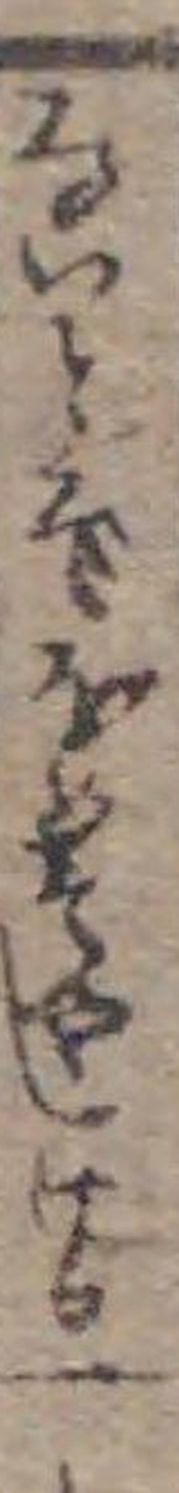ないとぞほめそやしける
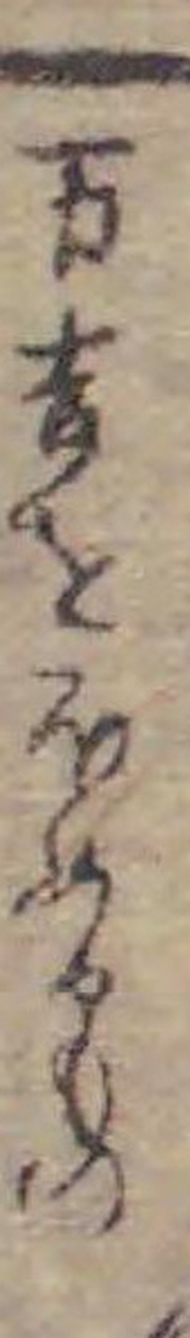万吉をほめるもの
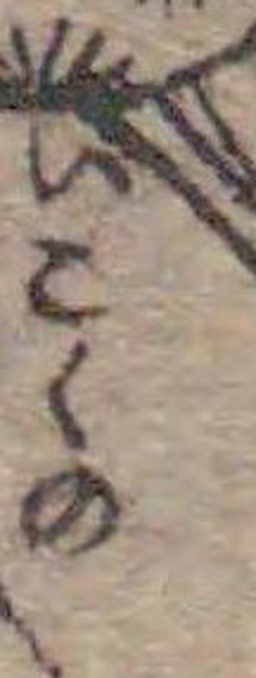いこくの
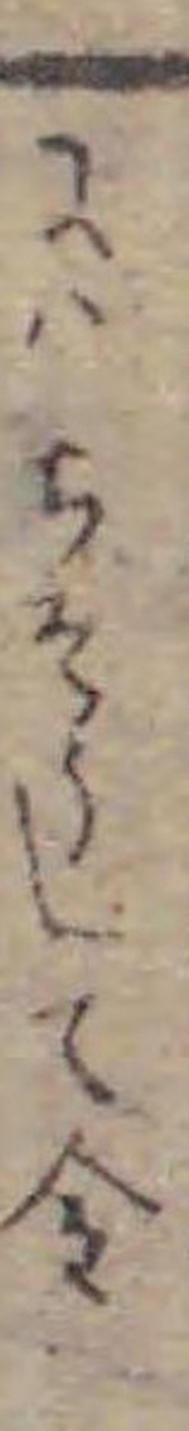にはちそうして金
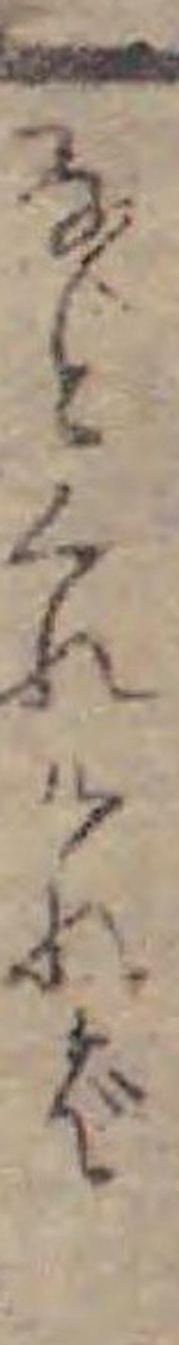なとくれければ
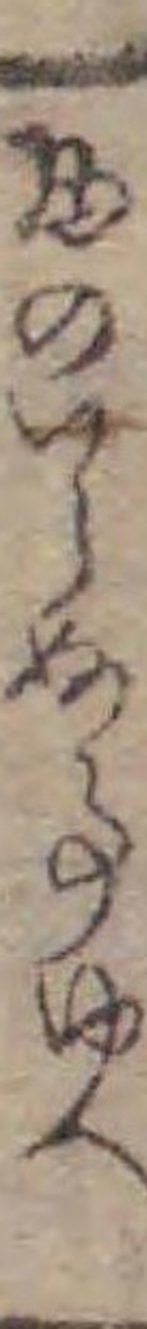物のいらぬ事ゆへ
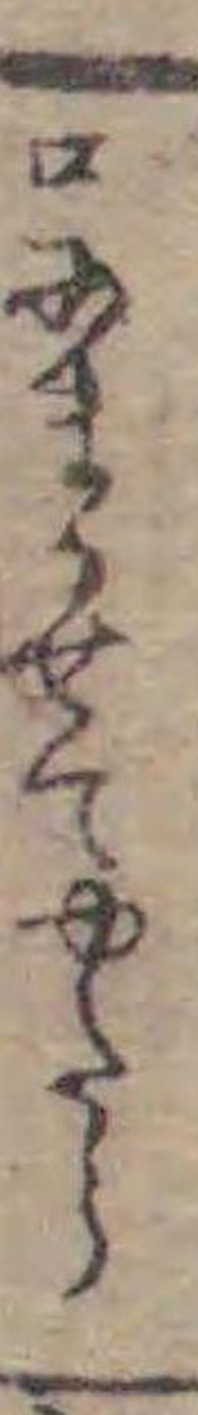口にまかせてやたら
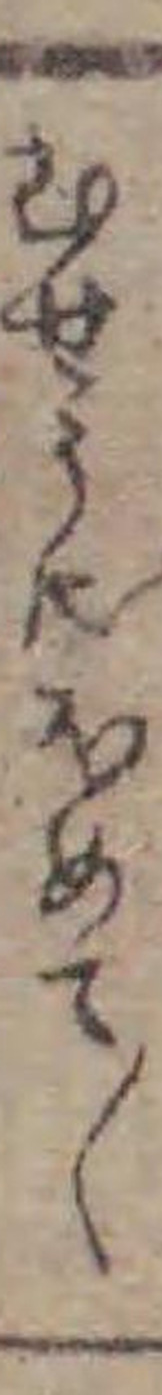むせうにほめて〳〵
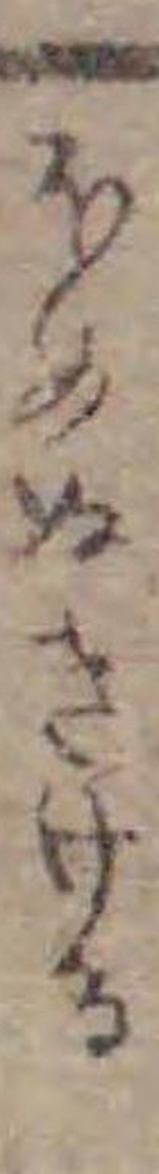ほめぬきける

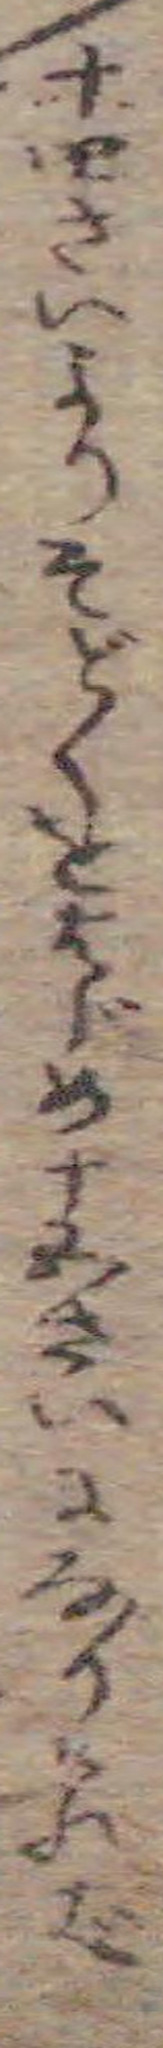十四さいよりそどくをはじめ十五さいになりければ
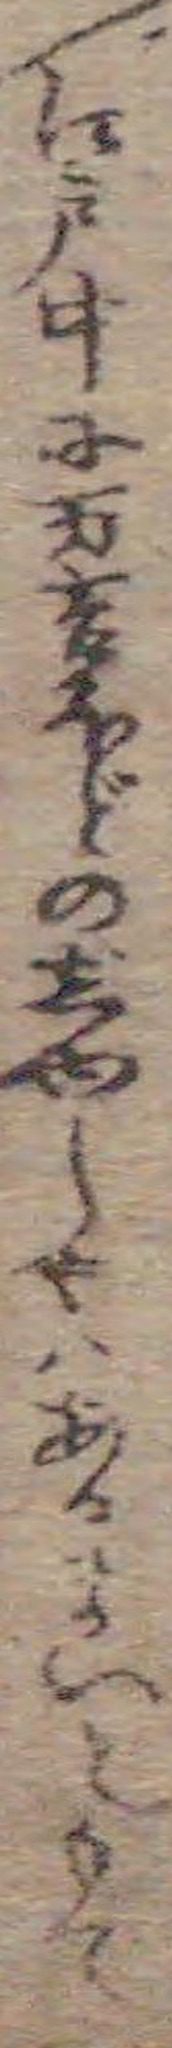江戸中に万吉ほどのじゆしやはあるまいともて
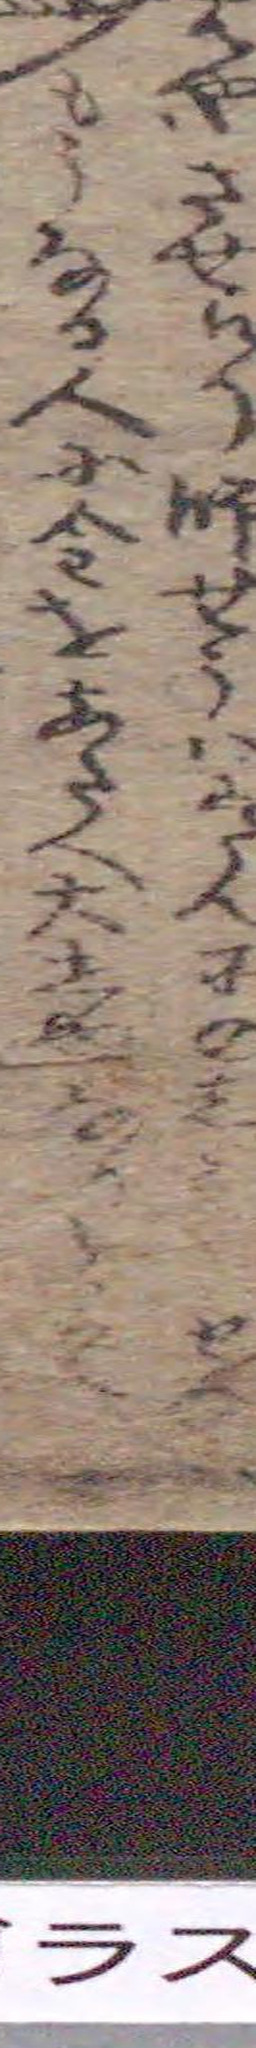もうなる人に金をあたへ大し？ゆなりとて
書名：鼻峰高慢男 : 2巻
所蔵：国立国会図書館 National Diet Library, JAPAN
